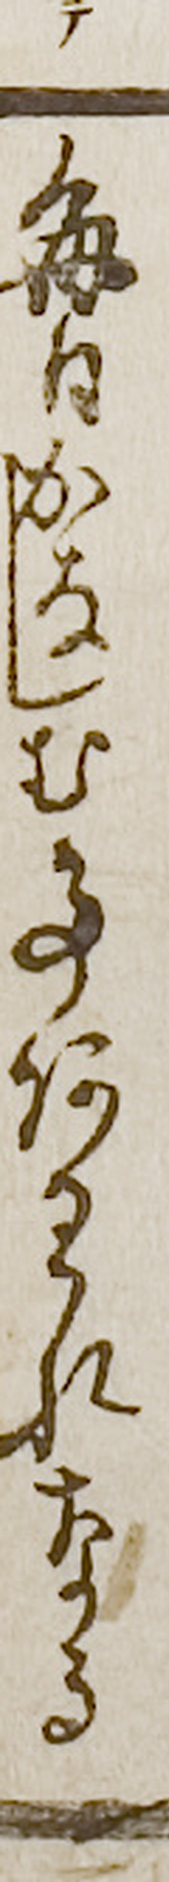毎日かなしむ事あわれなる
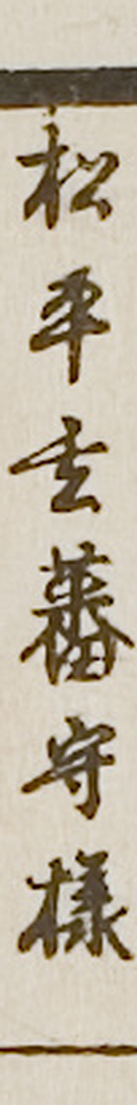松平玄蕃守様
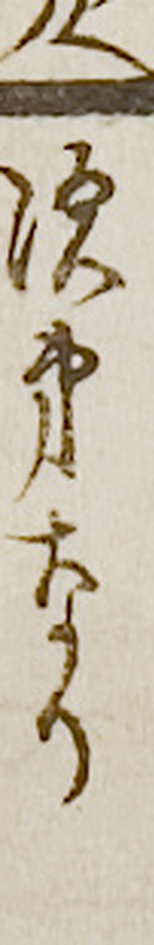次第なり
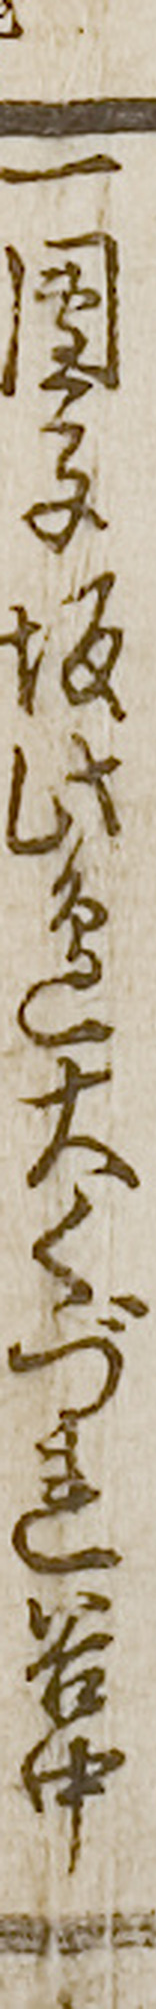一団子坂此辺大くづれ谷中
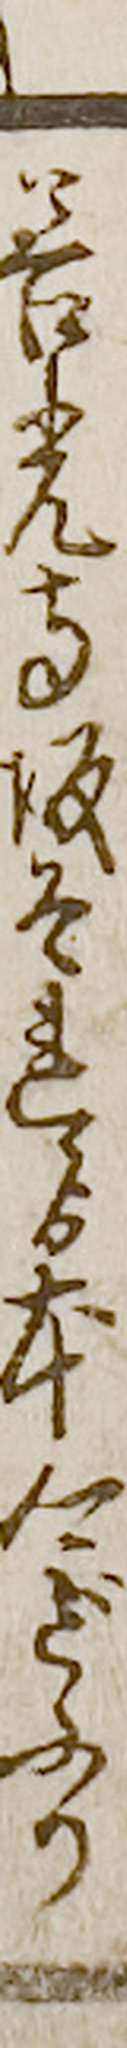善光寺坂それより本郷どふり
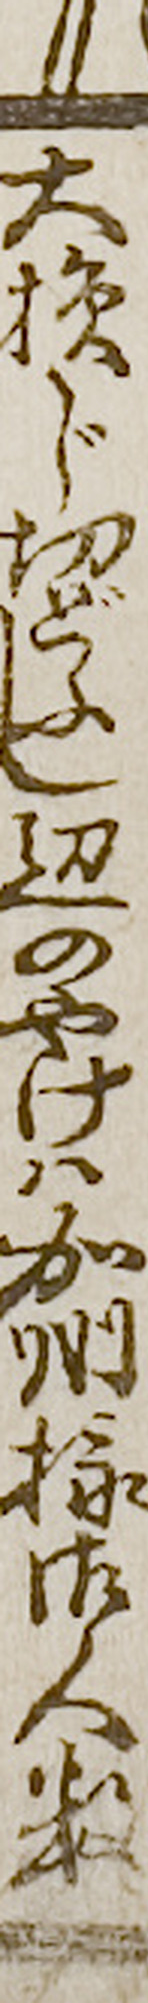大損じ切どふし辺のやけハ加州様御人数
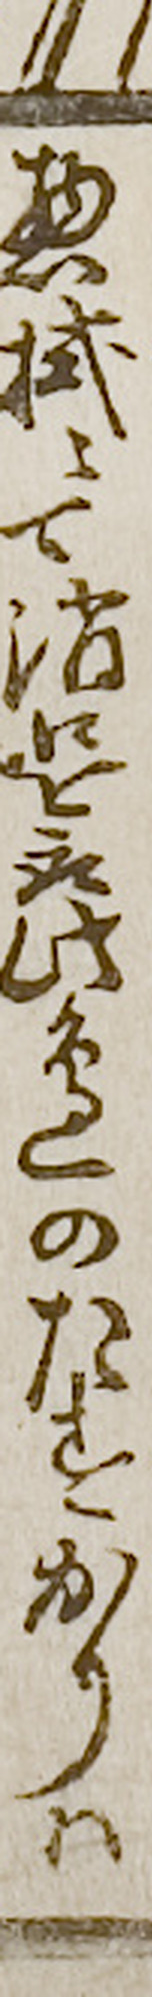惣掛ニて消口を取此辺のたすかりハ
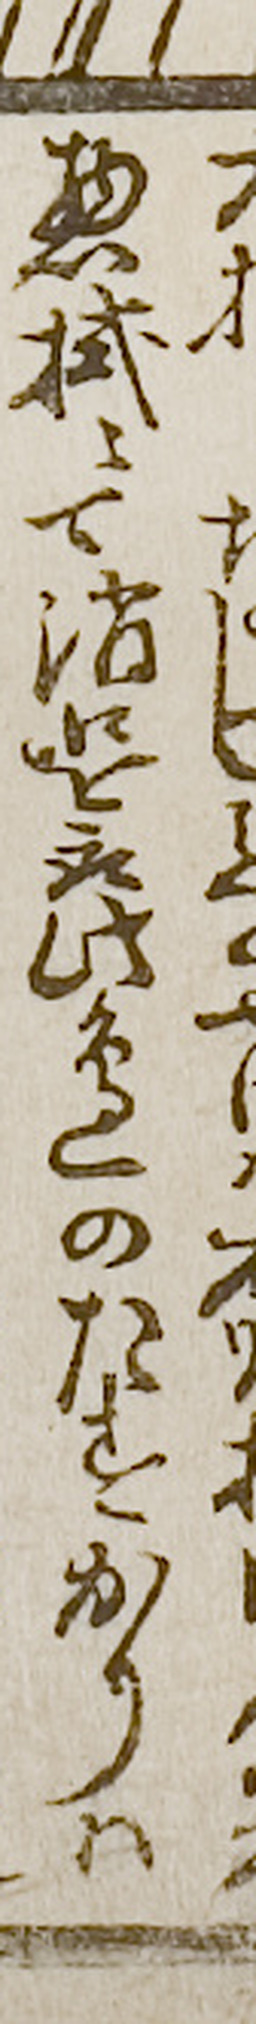惣掛ニて消口を取此辺のたすかりハ
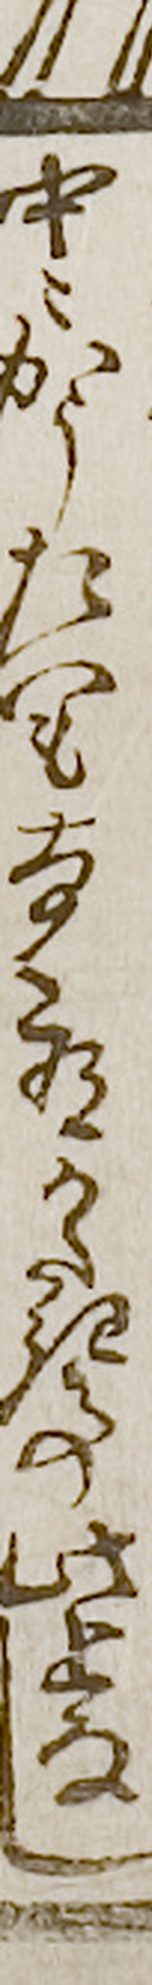中々かうたいもなく有かたき事此上なし
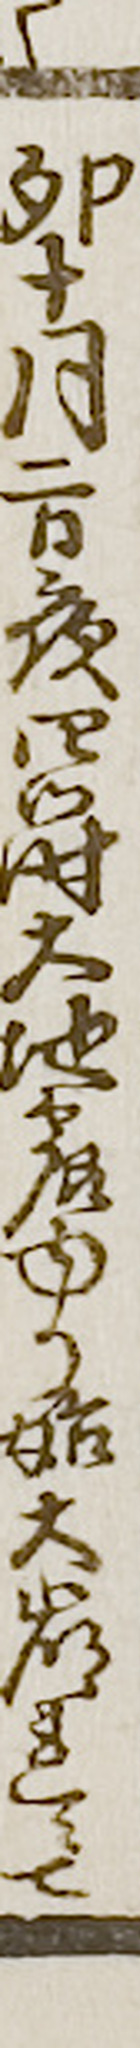卯十月二日夜四ツ時大地震ゆり始大崩れニて
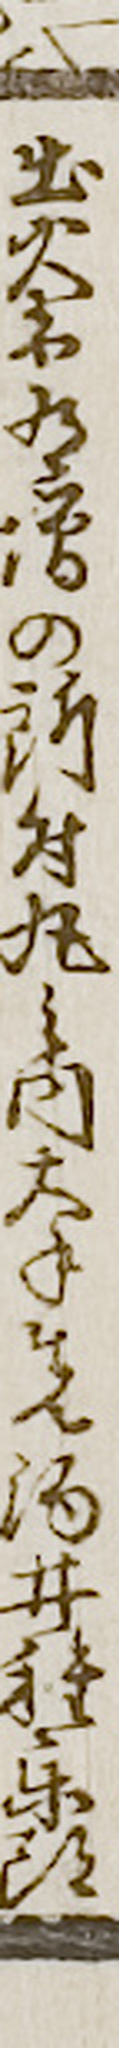出火有増の所付丸之内大手先酒井雅楽頭
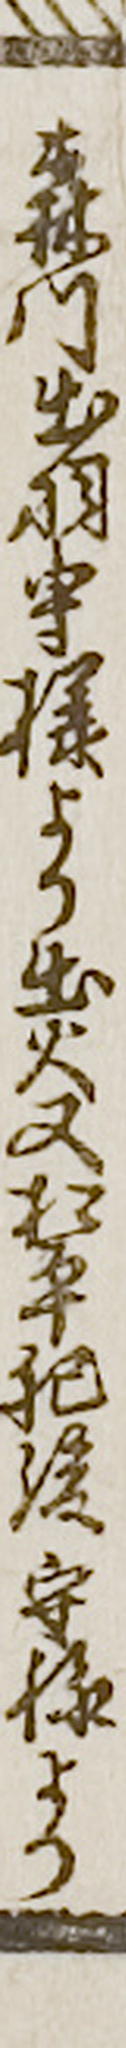森川出羽守様より出火又松平肥後守様より
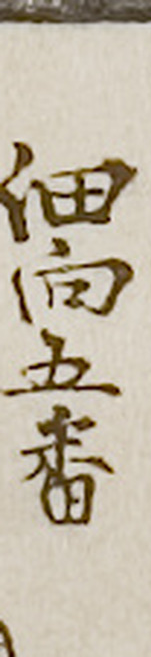佃向五番
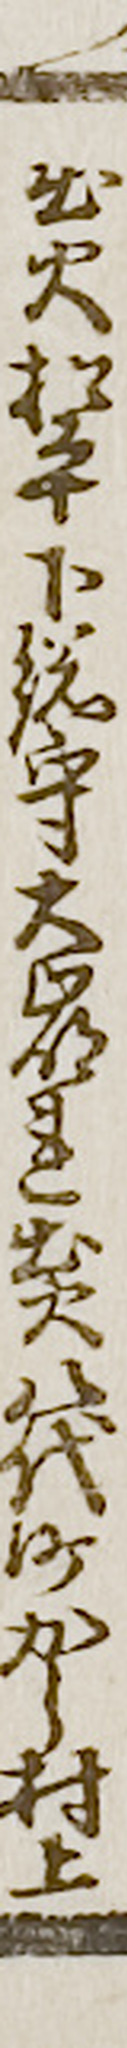出火松平下総守大崩れ出火八代町から村上
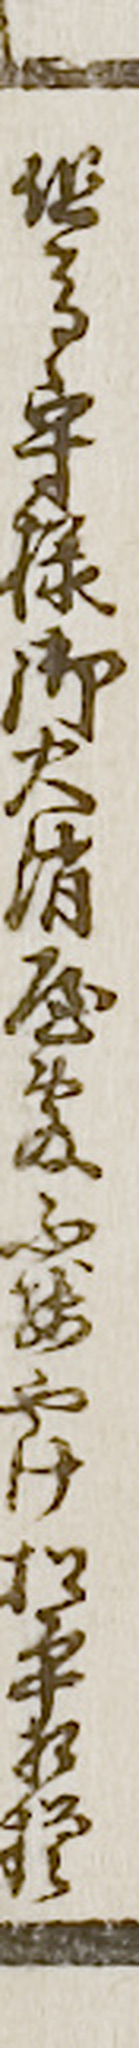但馬守様御火消屋敷不残やけ松平相模
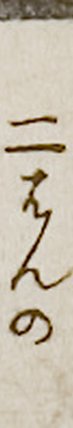二ばんの
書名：安政二乙卯歳十月二日夜ル四ツ時震始メ末代
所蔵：東京大学総合図書館 General Library in the University of Tokyo, JAPAN
